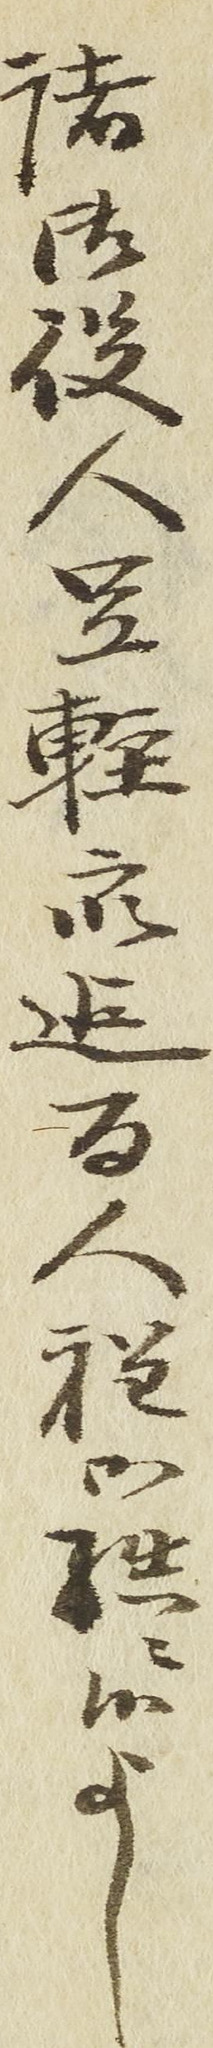諸御役人足軽衆迄百人程御詰二候よし
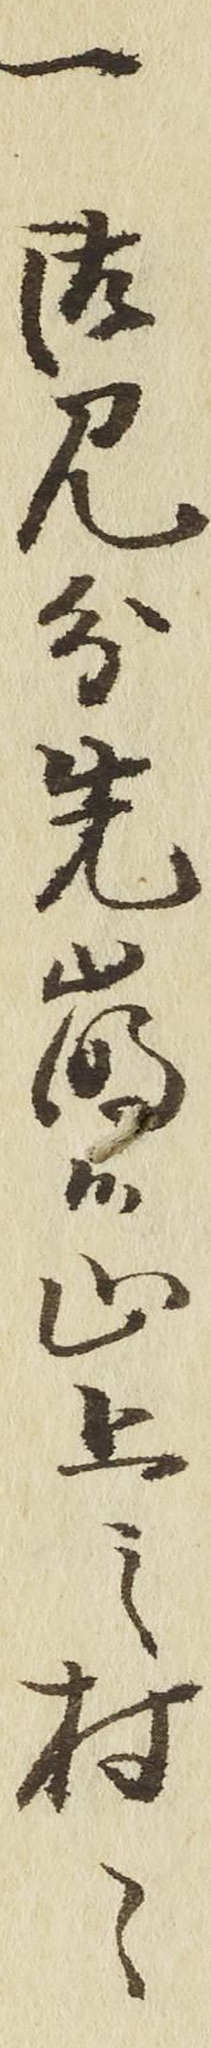一御見分先崩候山上之村々
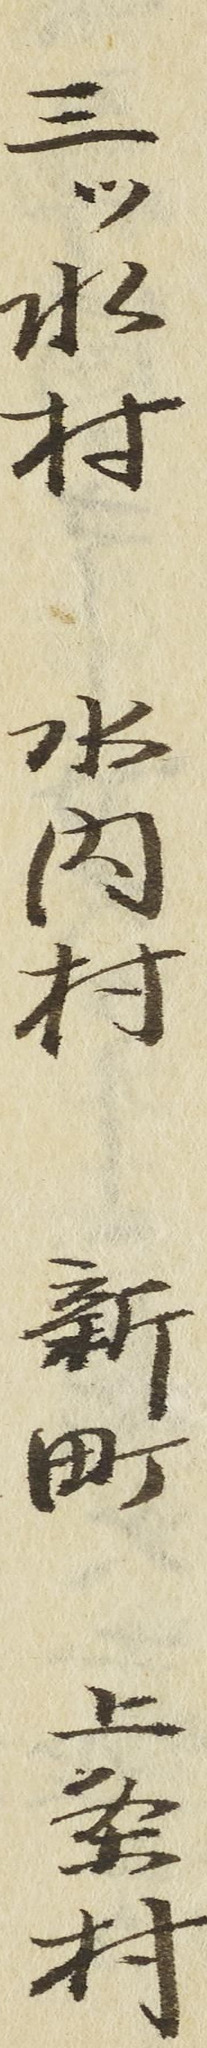三ッ水村水内村新町上条村
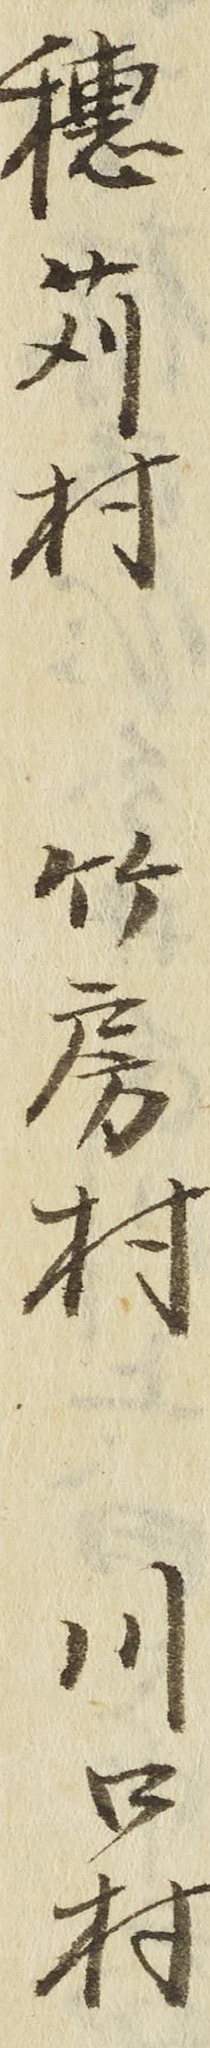穂苅村竹房村川口村
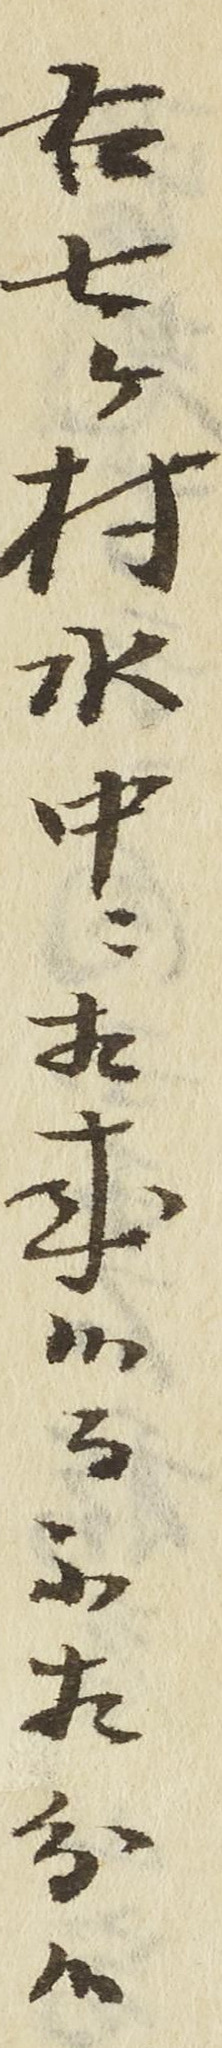右七ヶ村水中に相成候而不相分候
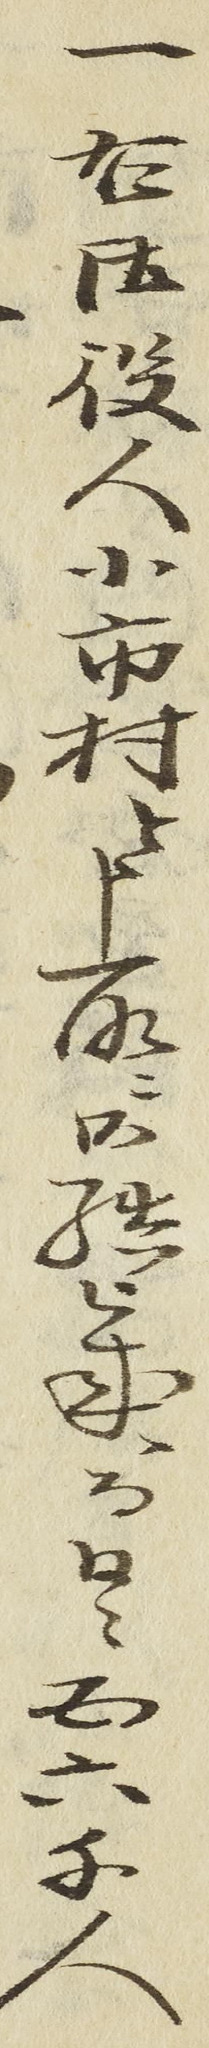一右御役人小市村と申所二御詰被成候時日々五六千人
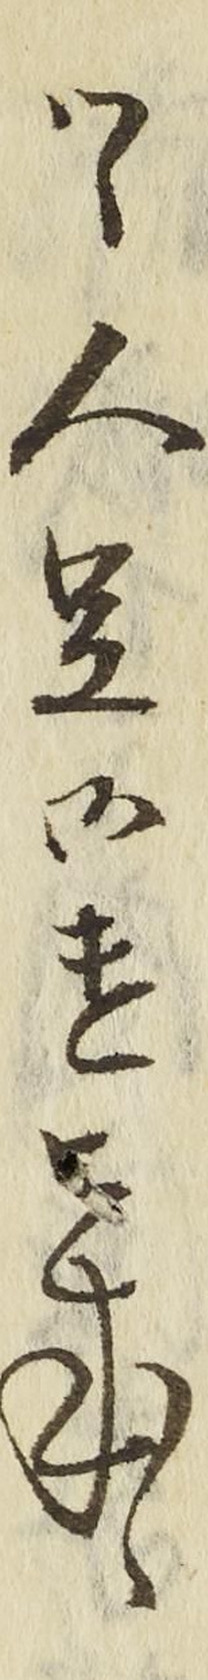ツゝ人足御遣被成候
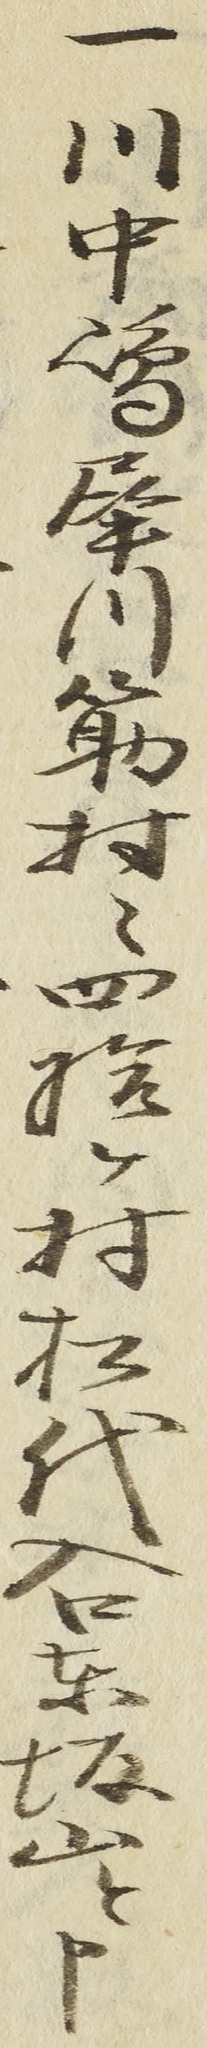一川中嶋犀川筋村々四拾ヶ村松代入口東坂山と申
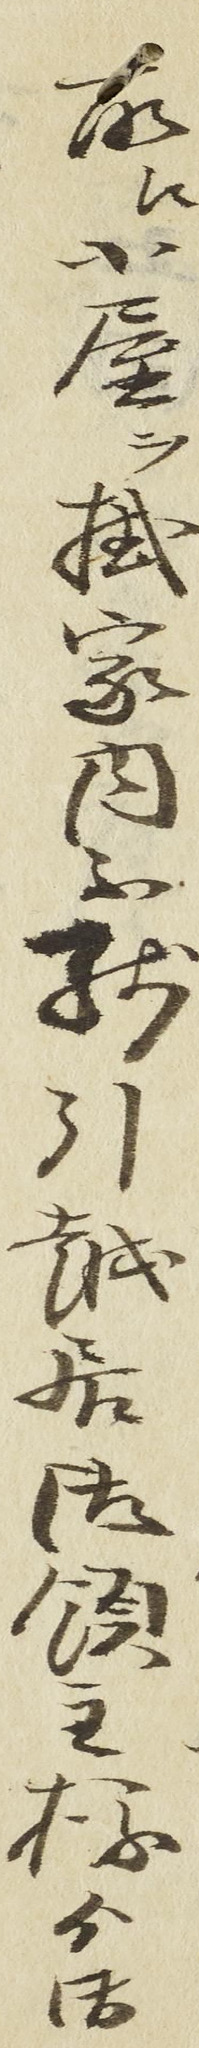処江小屋ヲ掛家内不残引越居御領主様ゟ御
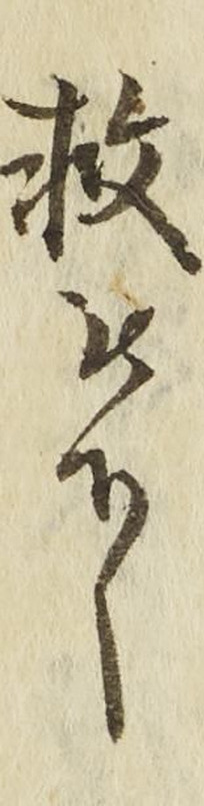救被下候
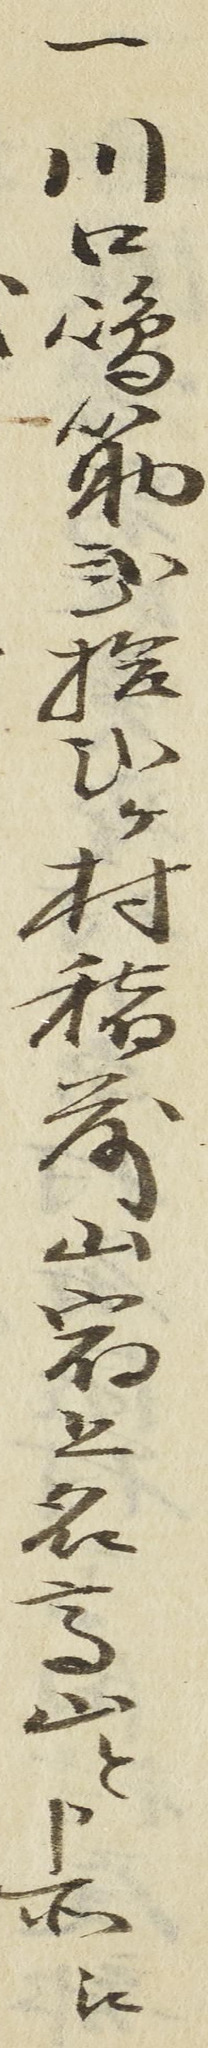一川口嶋筋弐拾弐ヶ村稲荷山宿上名高山と申所江
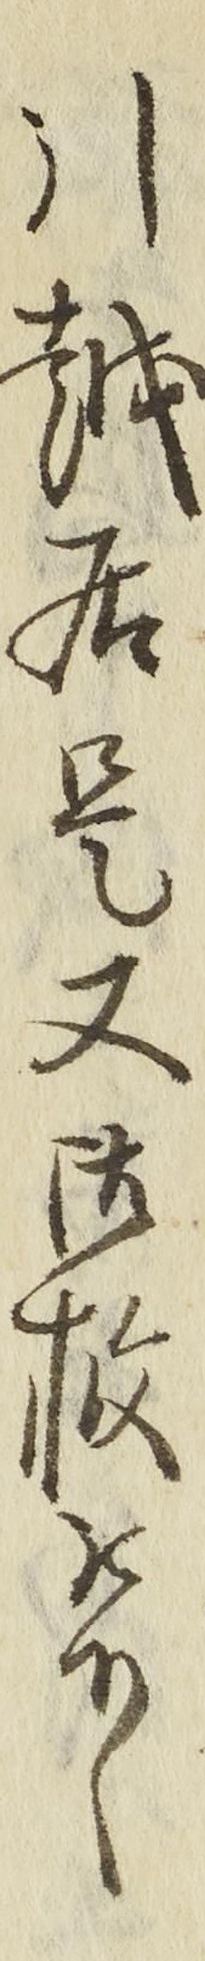引越居是又御救被下候
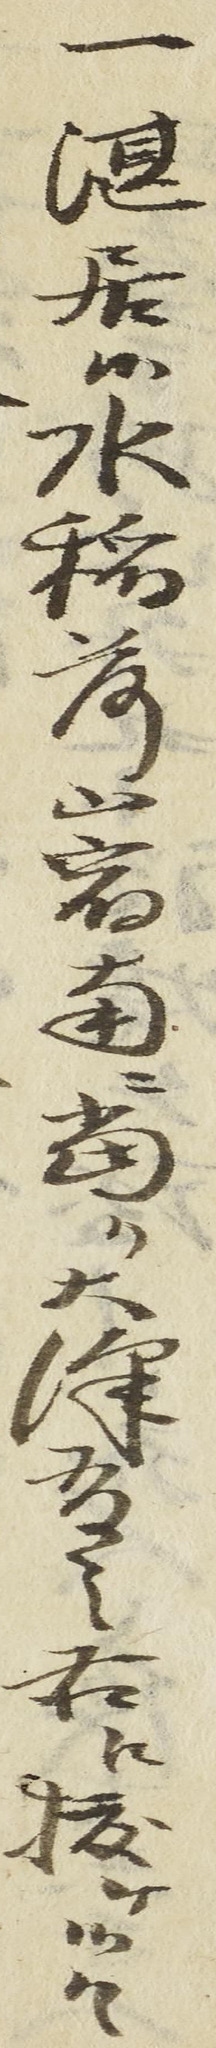一湛居候水稲荷山宿南二当り大沢有之右江抜ヶ候ハゝ
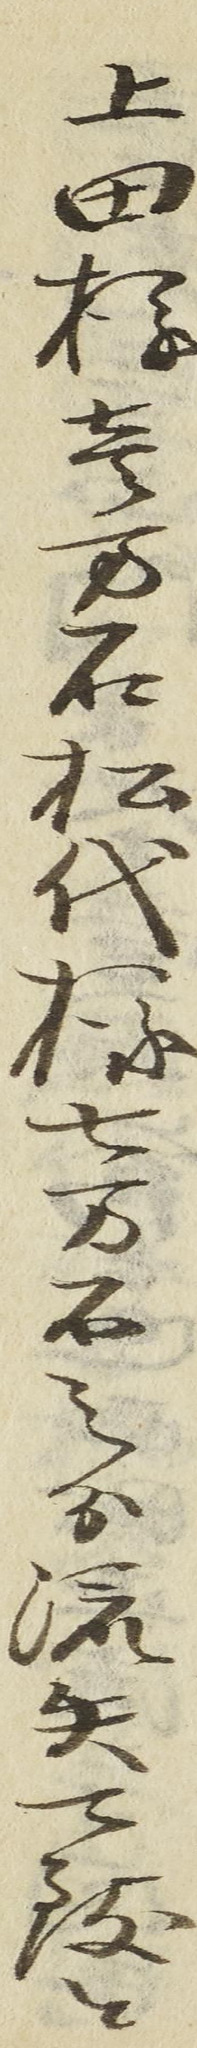上田様壱万石松代様七万石之分流失可致と
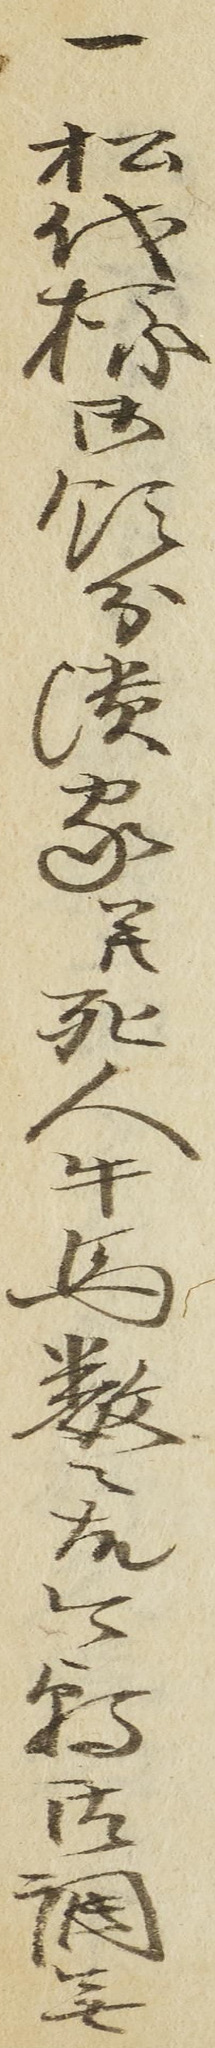一松代様御領分潰家并死人牛馬数々故今朝御調無

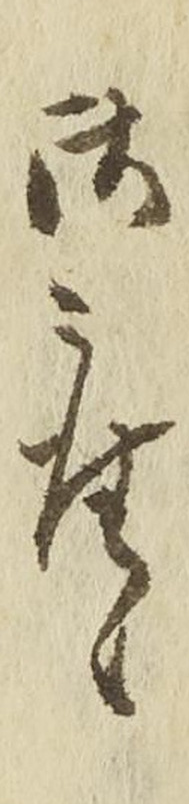御座候
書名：信濃國大地震記　乾
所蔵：東京大学地震研究所図書室 Earthquake Research Institute Library, The University of Tokyo, JAPAN
